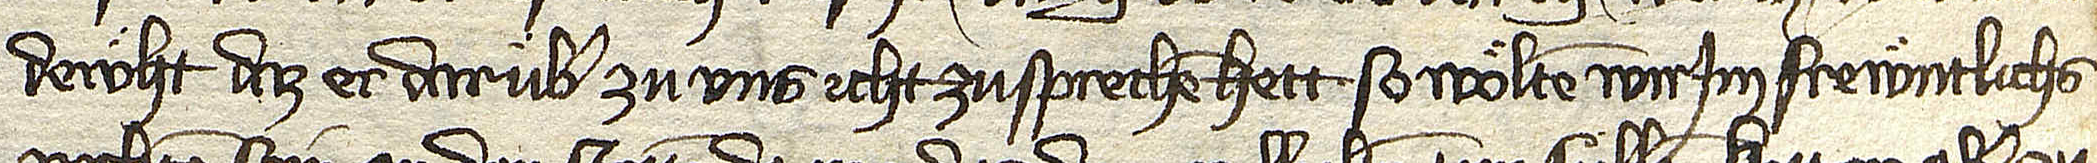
deẅht daʒ er darüb* ʒu vns icht ʒu ſpreche* hett . ſo wölte* wir Im freẅntlichs
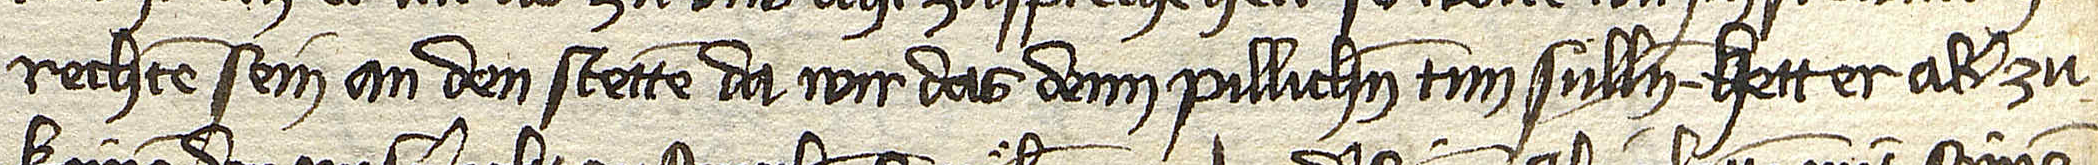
rechte* ſein an den ſtette* da wir das denn pillichn* tun ſülln* . hett er ab* ʒu
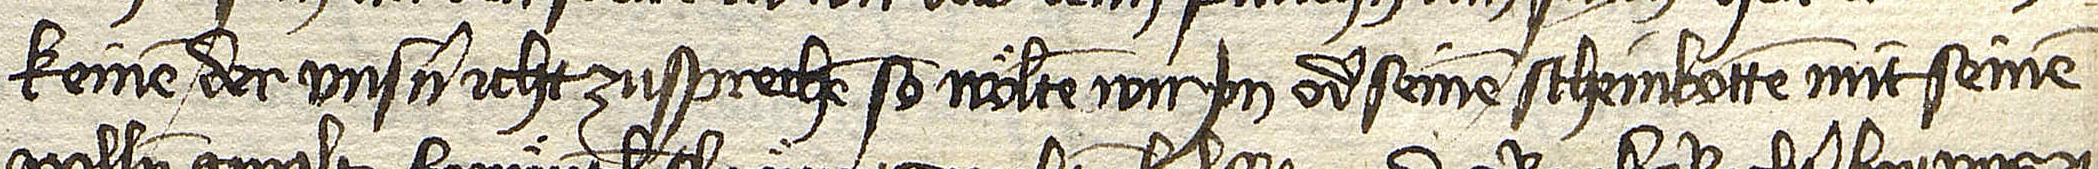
keine* der vnſn* icht ʒu ſpreche* ſo wölte* wir In od* ſeine* ſcheinbotte* mit ſeine*
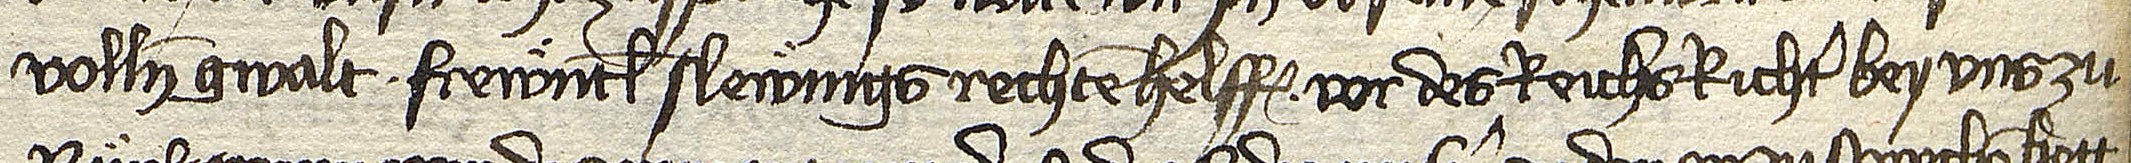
volln* gwalt . freẅntl* ſleẅnigs rechte* helff* . vor des Reichs Richt* bey vns ʒu
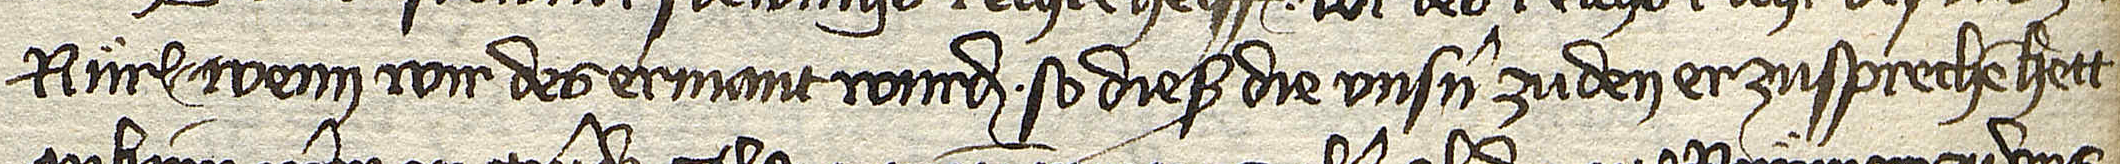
Nür* / wenn wir des ermant wurd* . ſo dieſ* die vnſn* ʒu den er ʒuſpreche* hett
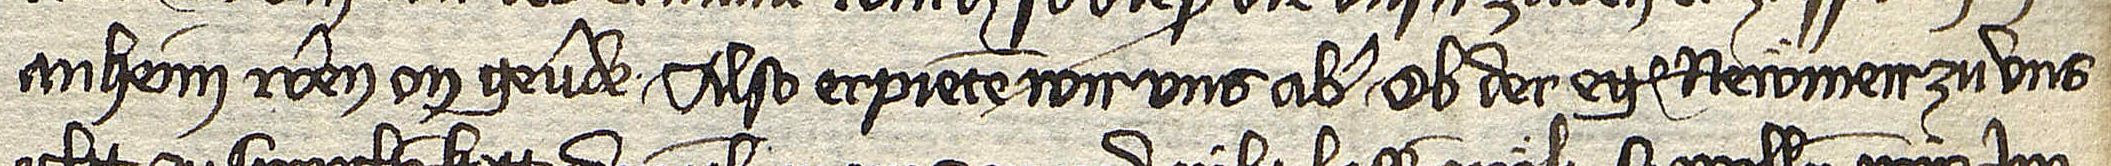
anheim w*en on geu*de / Alſo erpiete* wir vns ab* / Ob der eg* Neẅmeir ʒu Vns
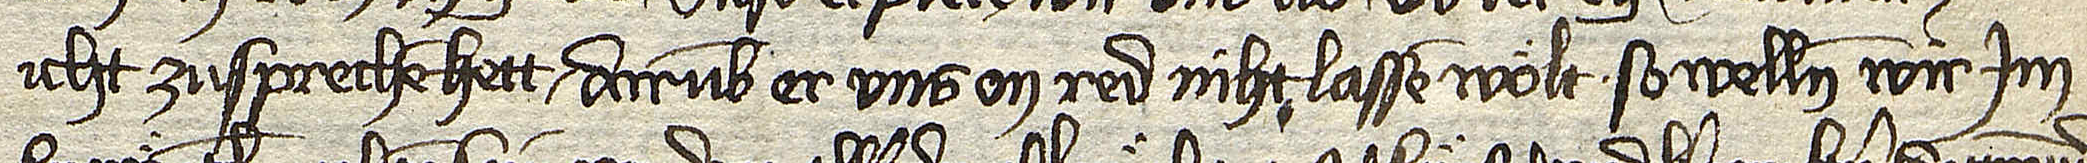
icht ʒuſpreche* hett / Darub* er vns on red niht laſſe* wölt . ſo welln* wir Im
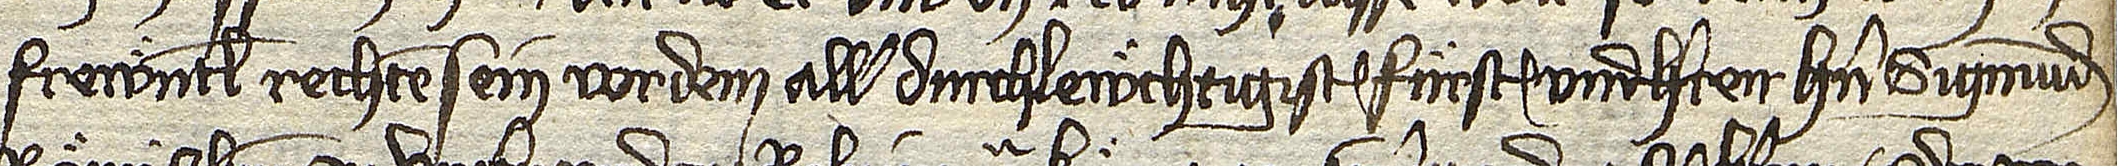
freẅntl* rechte* ſein vor dem all* durchleẅchtigiſt* fürſt* vnd h*ren hn* Sigmu*d*
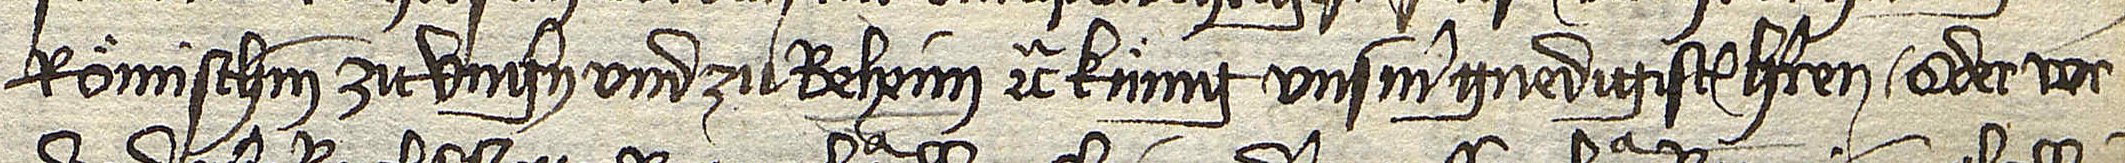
Römiſchm* ʒu Vng*n vnd ʒu Beheim ec* künig vnſm* gnedigiſt* h*ren / Oder vor
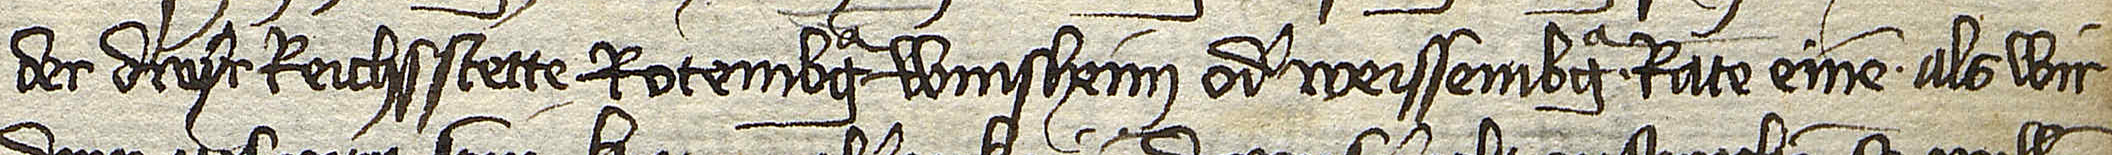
der dry*r Reichſſtette Rotemb*g winſheim od* weiſſemb*g Rate eine . als wir
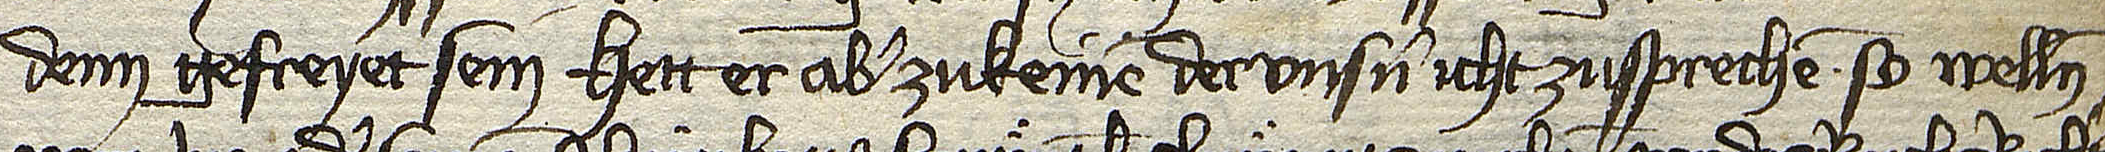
denn gefreyet ſein Hett er ab* ʒu keine* der vnſn* icht ʒuſpreche* . ſo welln*
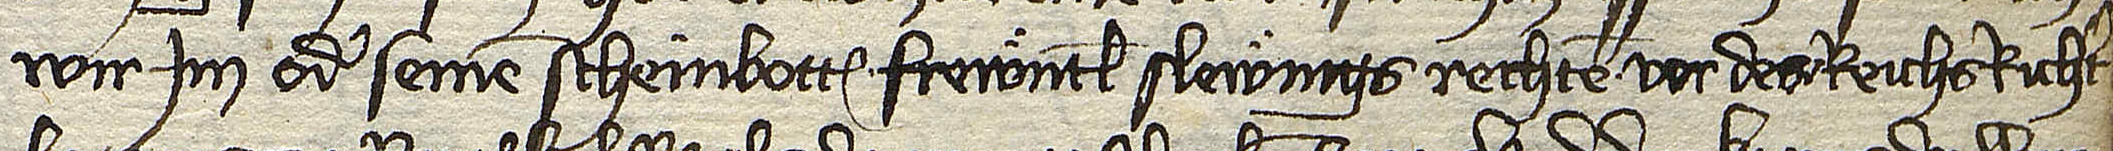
wir Im od* ſeine* ſcheibott* freẅntl* ſleẅnigs rechte* . vor des Reichs Richt*
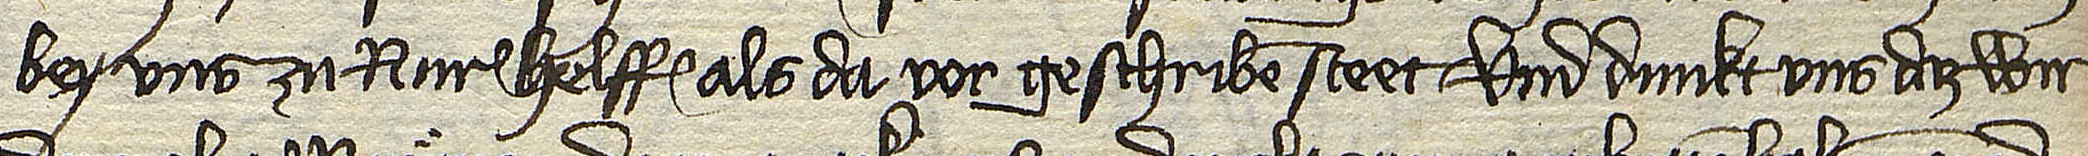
bey vns ʒu Nur* helff* als da vor geſchribe* ſteet / Vnd dunkt vns daʒ wir
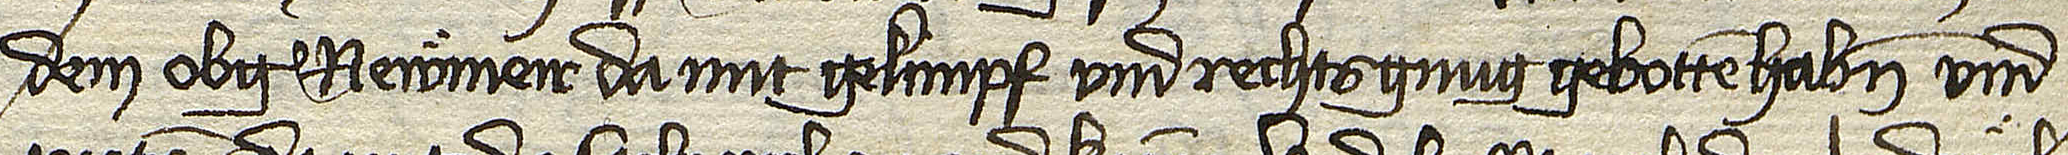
dem obg* Neẅmeir da mit gelimpf vnd rechts gnug gebotte* habn* vnd
